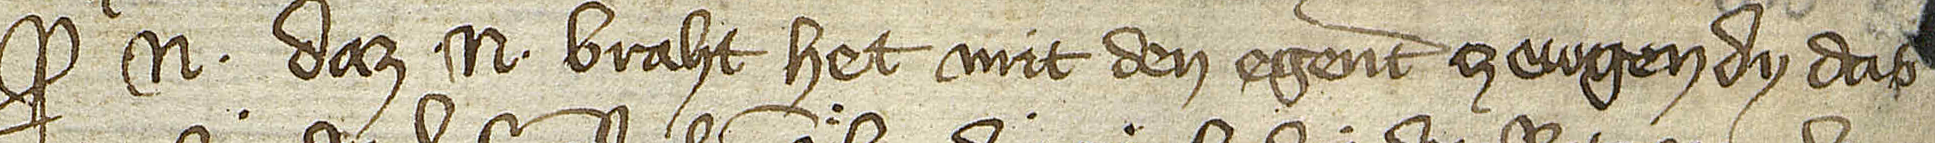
P* n* . daʒ . N . braht het mit den egent* cʒewgen dy das
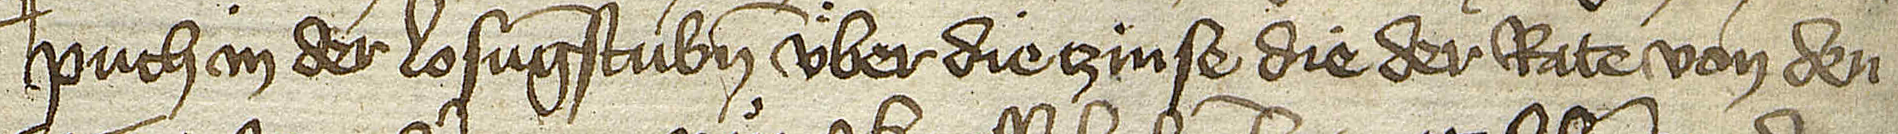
puch in der loſu*gſtub*n v̈ber die cʒinſe die der Rate von den
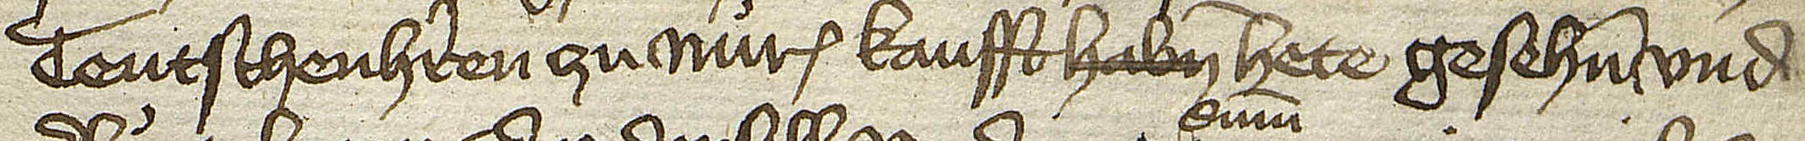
Teutſchenh*ren cʒu Nür* kaufft hab*n hete geſeh*n vnd
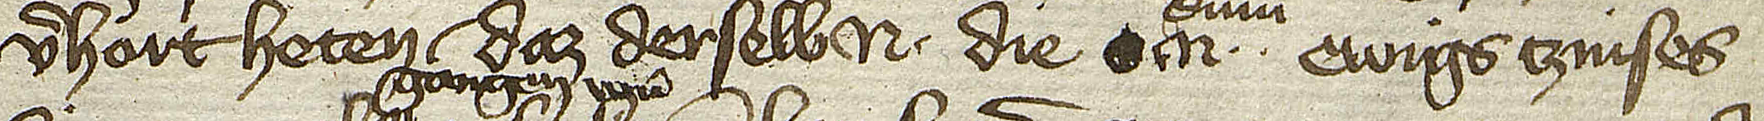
v*hört heten / daʒ derſelb . N* . die S N . ewigs cʒinſes
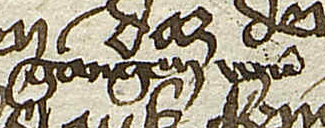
gangen wn*
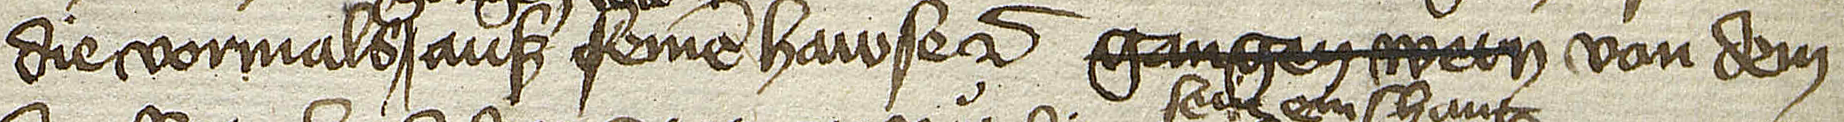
die vormals auſʒ ſeine* hawſe ec* gangen wern von dem
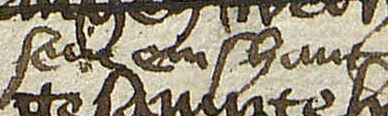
ſein einſhant
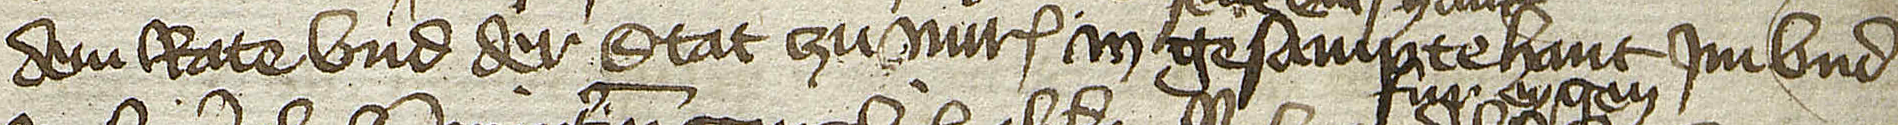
dem Rate vnd der Stat cʒu Nür* in geſampte hant Im vnd
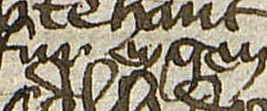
fur eygen
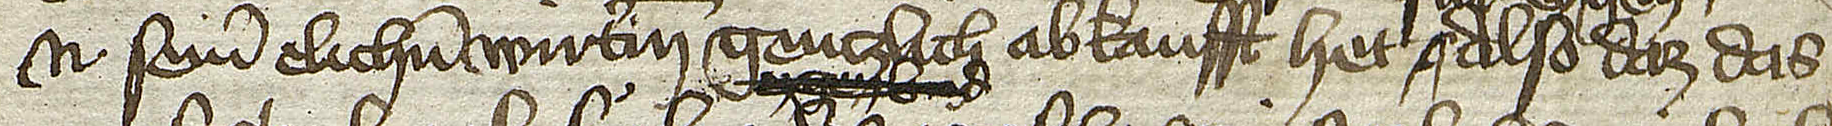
N . ſein* elich*n wirtin gencʒlich abkaufft het / Alſo daʒ das
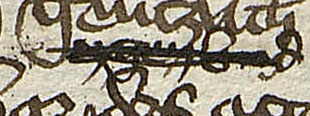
eygen vnd
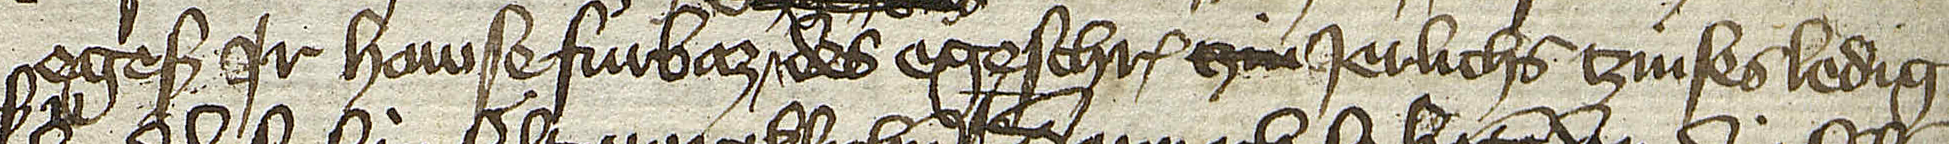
egeſ* Ir hawſe fürbaʒ des egeſchr* cʒin Ierlichs cʒinſes ledig
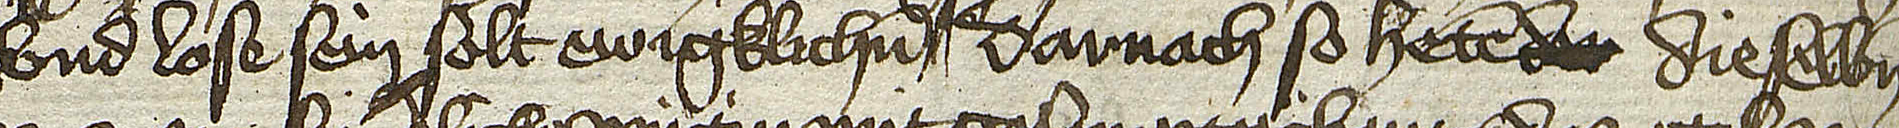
vnd loſe ſein ſolt ewigklich*n Darnach ſo hete* der dieſelb*n
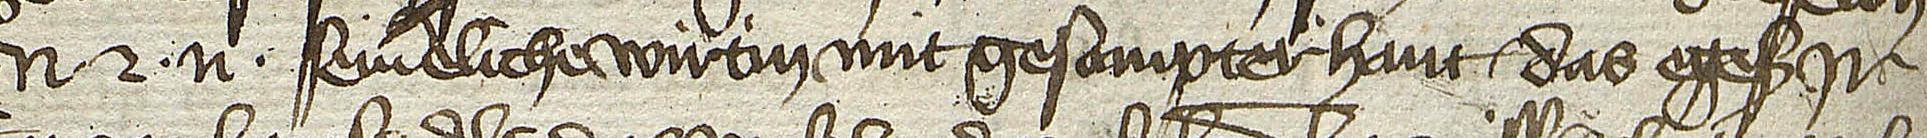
. N . @ . N . ſein* eliche wirtin mit geſampter hant / das egeſ* Ir
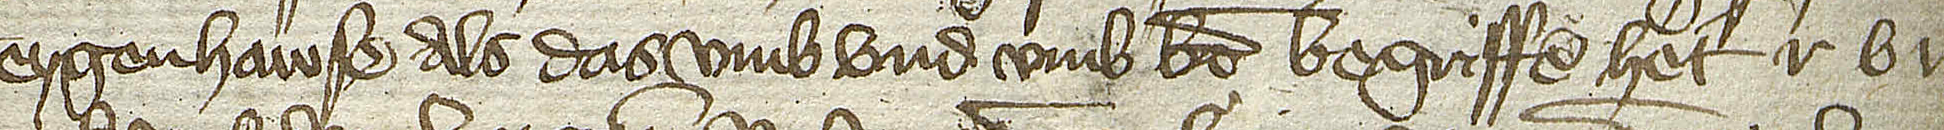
eygen hawſe Als das vmb vnd vmb ec* begriffe het r b r
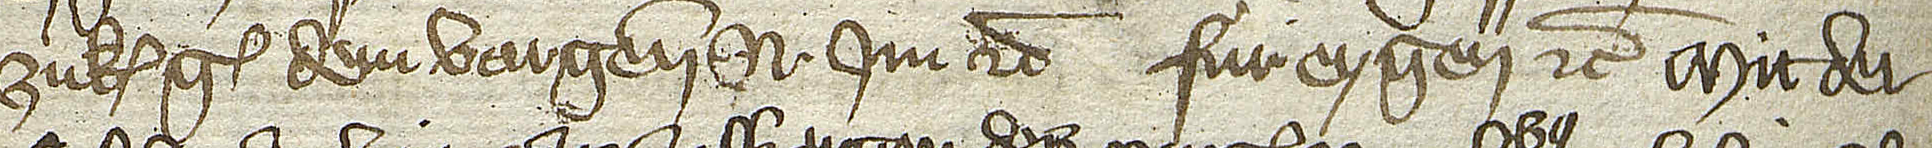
cʒuk* g* dem vorgen* N* Im ec* für eygen ec* Mit der
